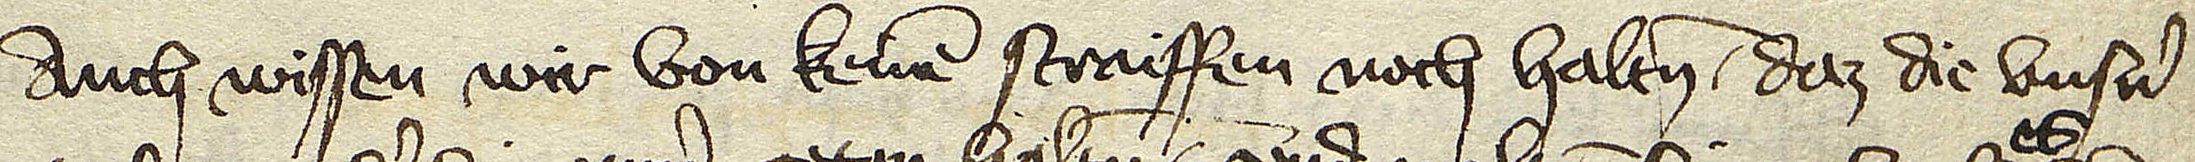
Auch wiſſen wir von keine* ſtraiffen noch haltn* / daʒ die vnſn*
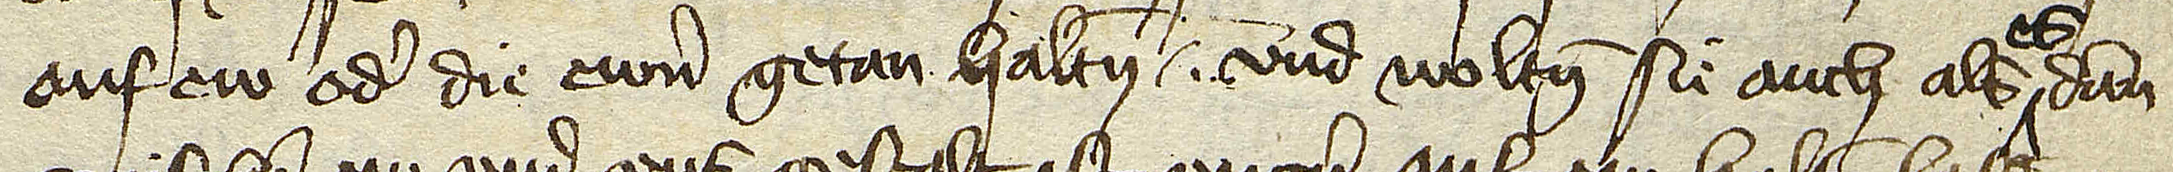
auf ew od* die ewn* getan haltn* / . vnd woltn* ſie auch als dan*
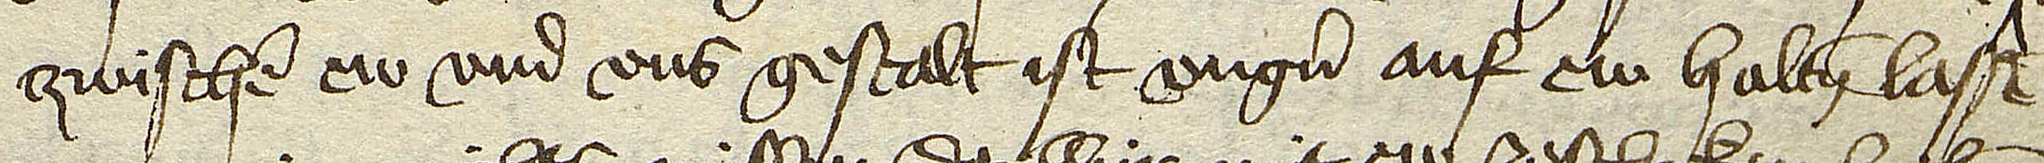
cʒwiſche* ew vnd vns geſtalt iſt vngn* auf ew haltn* laſſe*
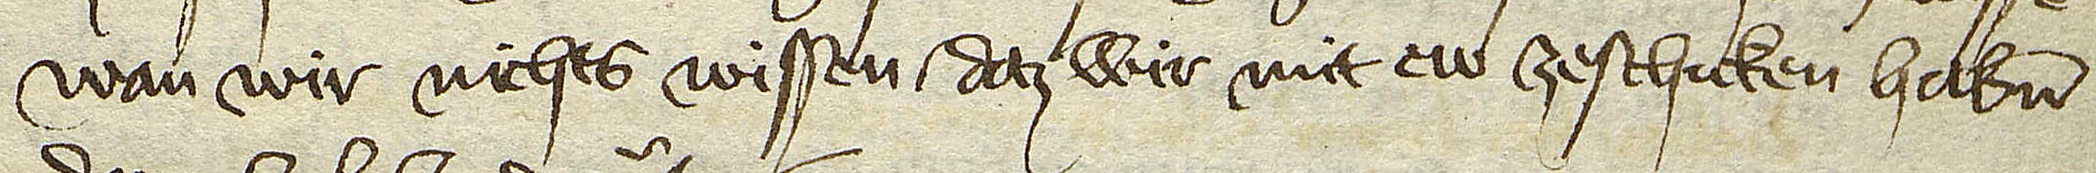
wan wir nichts wiſſen / daʒ wir mit ew cʒeſchicken habn*
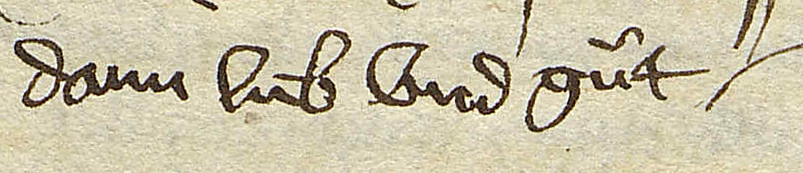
dann lieb vnd güt /
